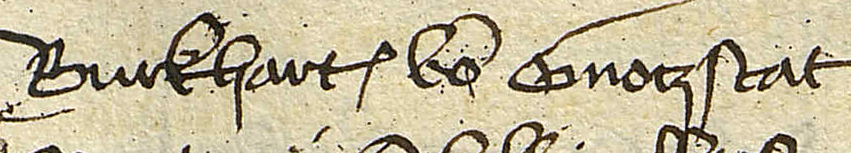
Burkhart* vo* Gnocʒſtat
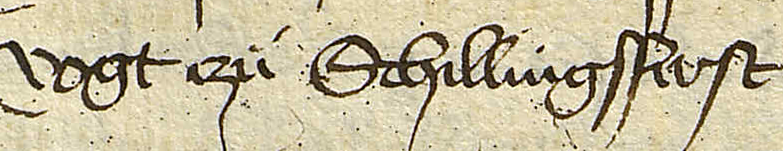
vogt cʒü Schillingſf%%ſt
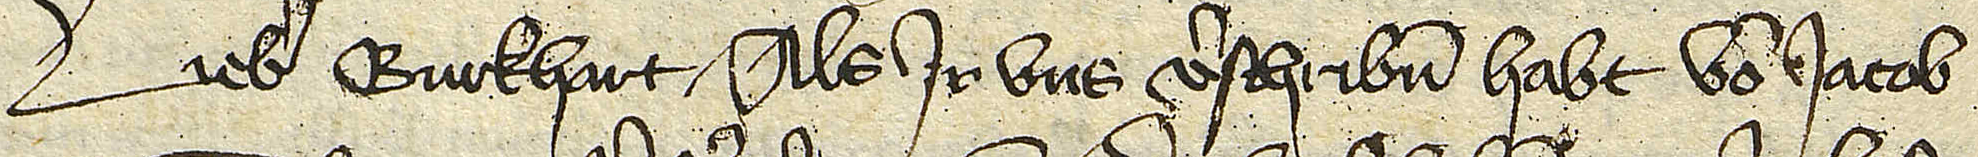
Lieb* Burkhart / Als Ir vns v*ſchribn* habt vo* Iacob
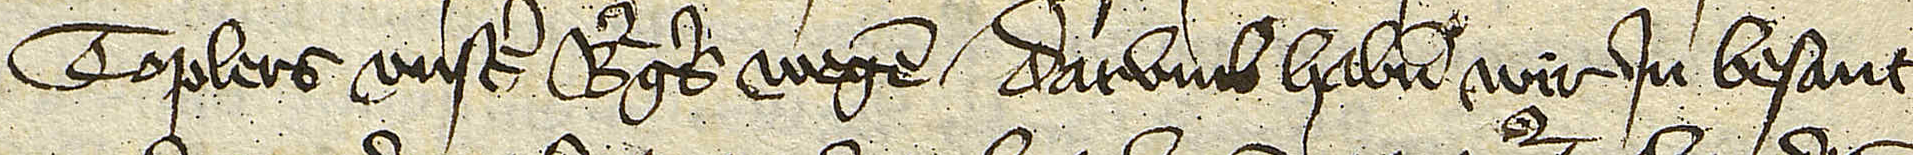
Toplers vnſs* B*g*s wege* / Darvmb habn* wir In beſant
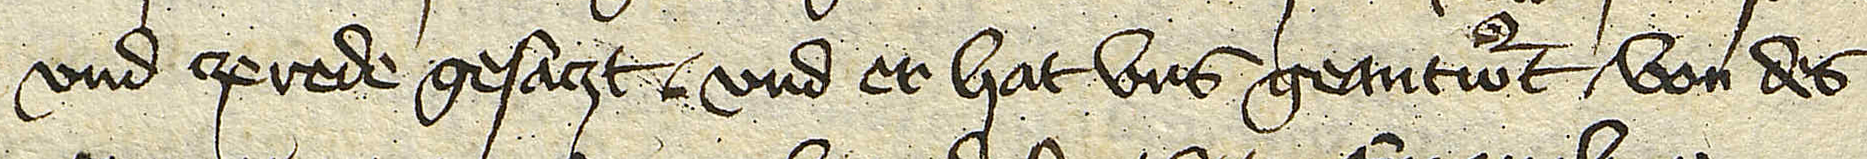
vnd cʒerede geſacʒt / vnd er hat vns geantwt* / von des
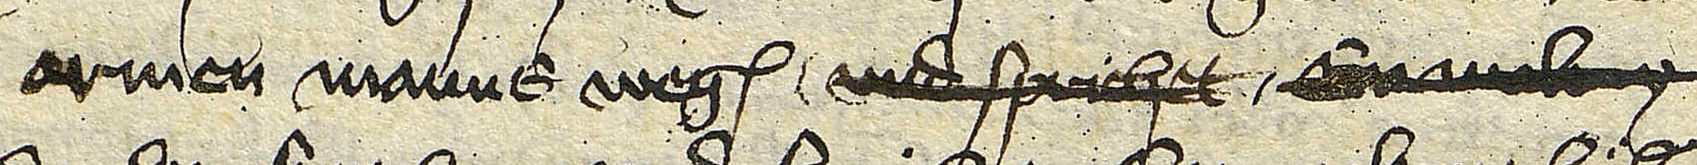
armen manns weg* / vnd ſprichet / Er wolt y
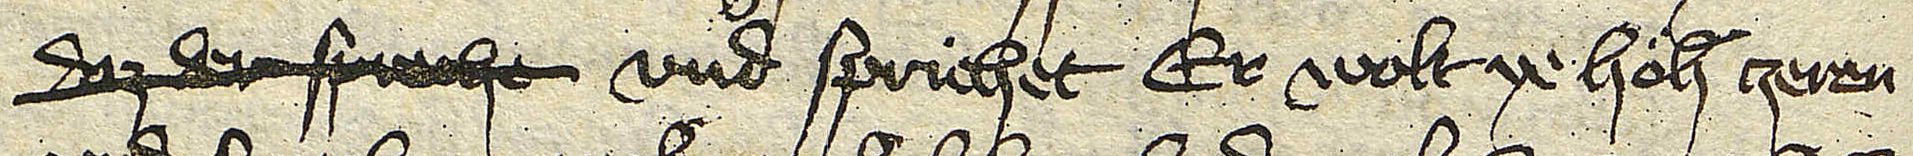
daʒ der ſpreche vnd ſprichet Er wolt ye höh cʒeren
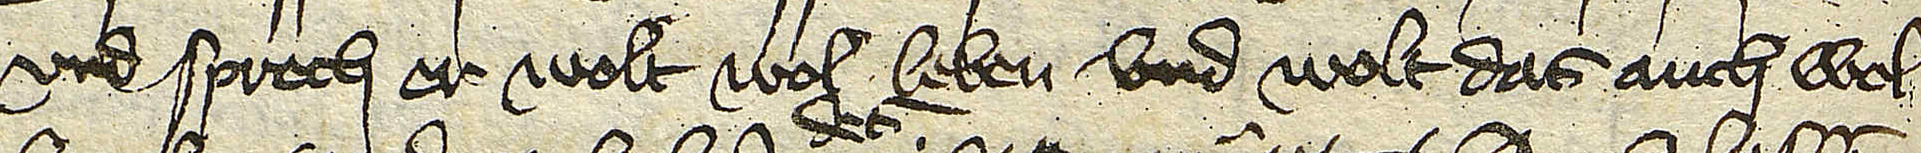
vnd ſprech er wolt wol leben / vnd wolt das auch wol
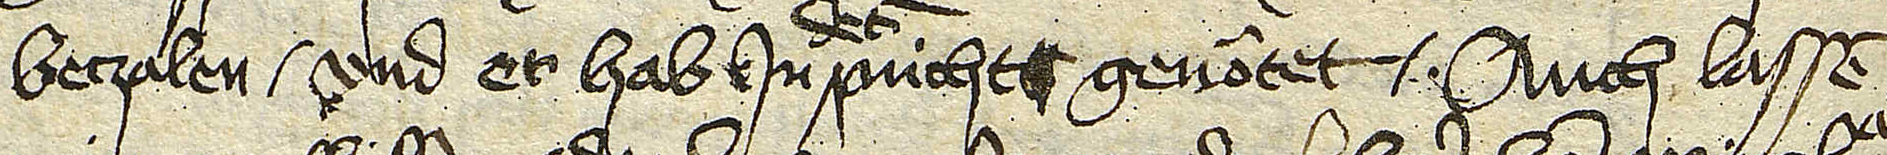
becʒalen / vnd er hab In nichts genötet / . Auch laſſe*
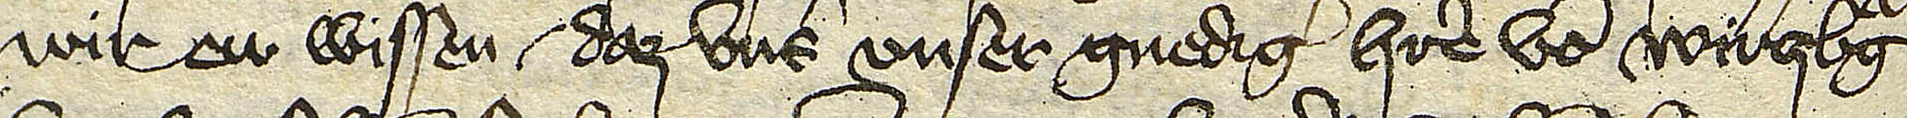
wir ew wiſſen / daʒ vns vnſer gnedig* hr*e vo* wircʒb*g
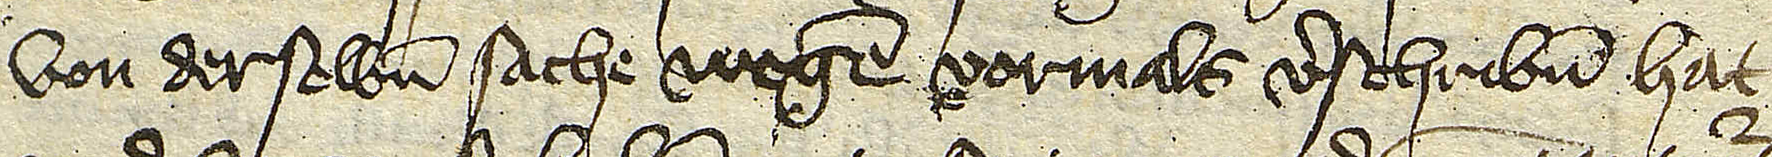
von derſelbn* ſache wege* vormals v*ſchribn* hat
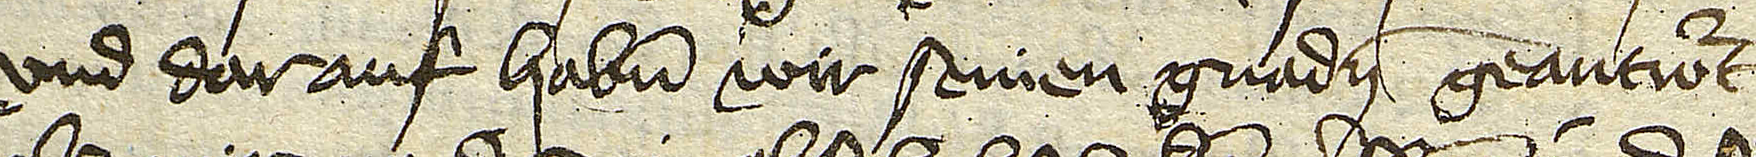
vnd darauf habn* wir ſeinen gnadn* geantwt*
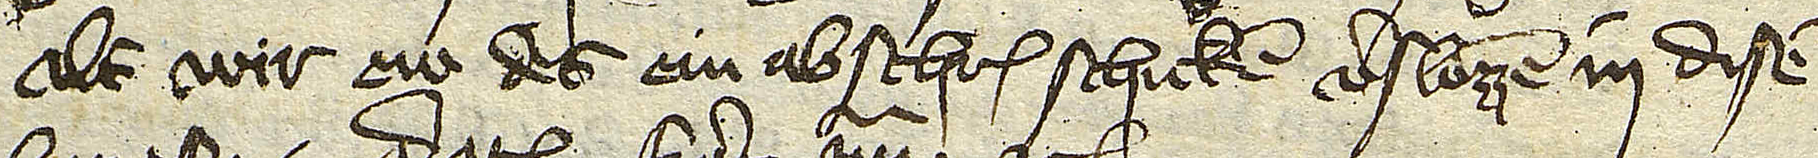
als wir ew des ein abſchr* ſchicke* v*ſloʒʒe* in diſe*
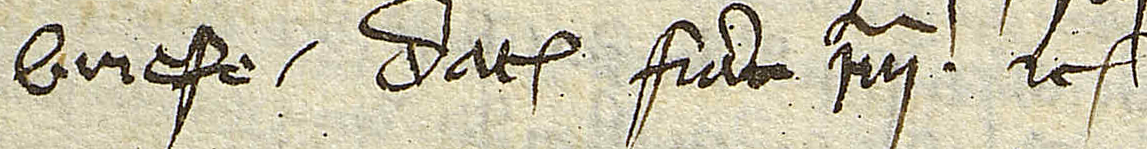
briefe / Dat* fia* iiii* . ec*
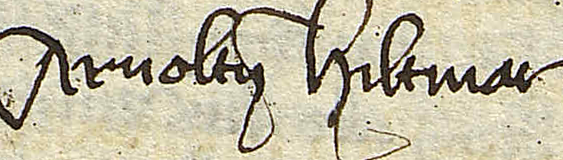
Arnoltn* Hiltmar
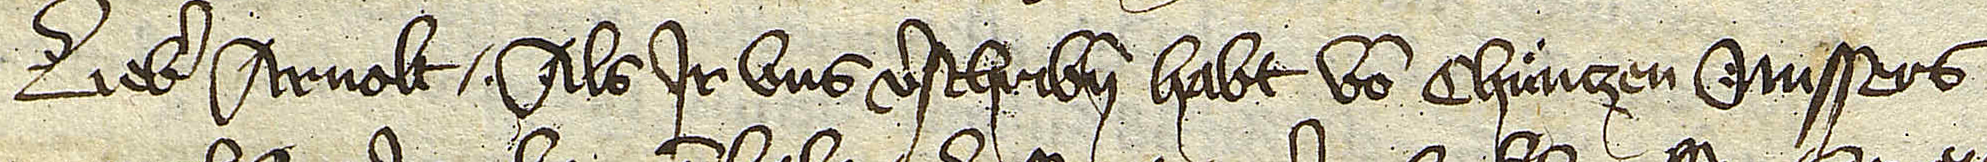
Lieb* Arnolt / . Als Ir vns v*ſchribn* habt vo* Chüncʒen Nuſſers
